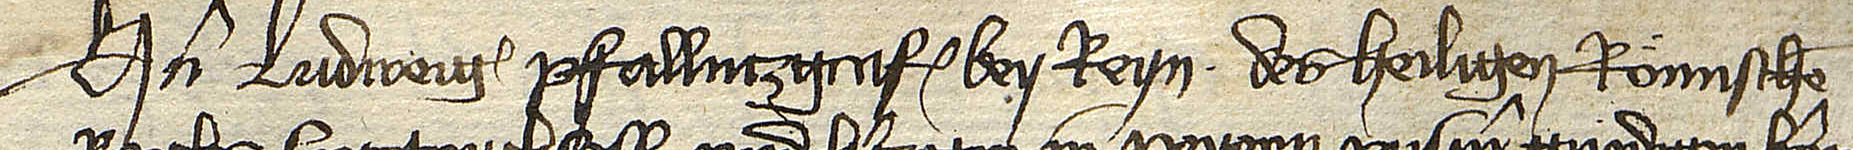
Hn* Ludweig* pfallncʒgraf* bey Reyn . des heiligen Römiſche*
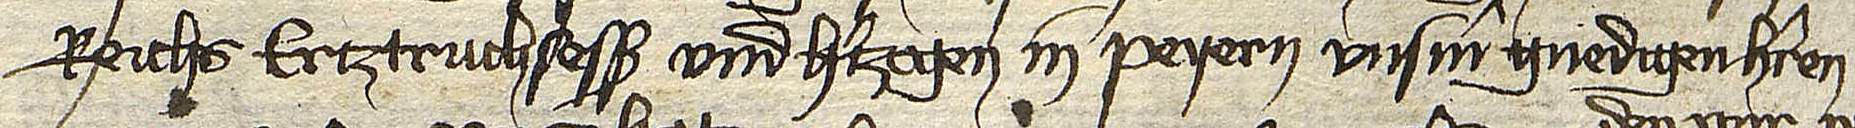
Reichs Ercʒtruchſeſſ* vnd h*cʒogen in Peyern vnſm* gnedigen h*ren
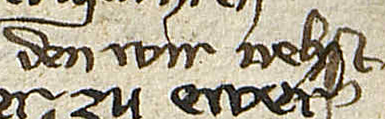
den wir nehſt
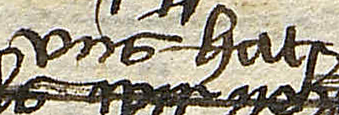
vns hat
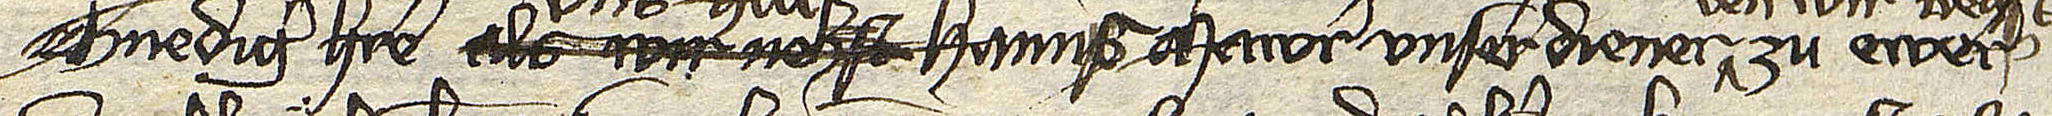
Gnedig* h*re als wir nehſt hannſ* Mawr* vnſer* diener ʒu ewer
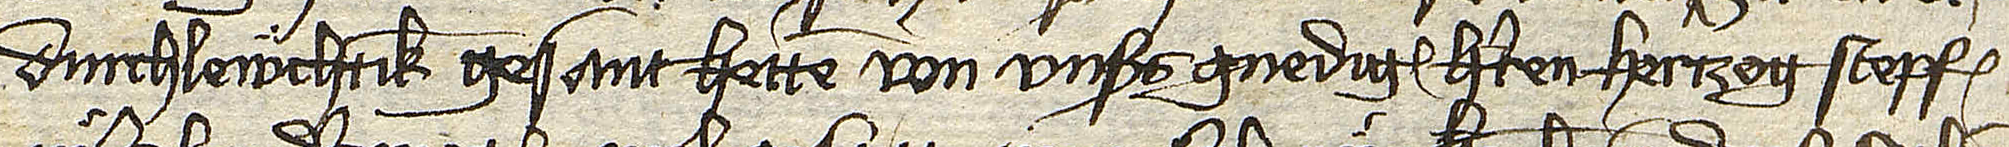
durchleẅchtik* geſant hette* von vnſ*s gnedig* h*ren hercʒog ſtepf*
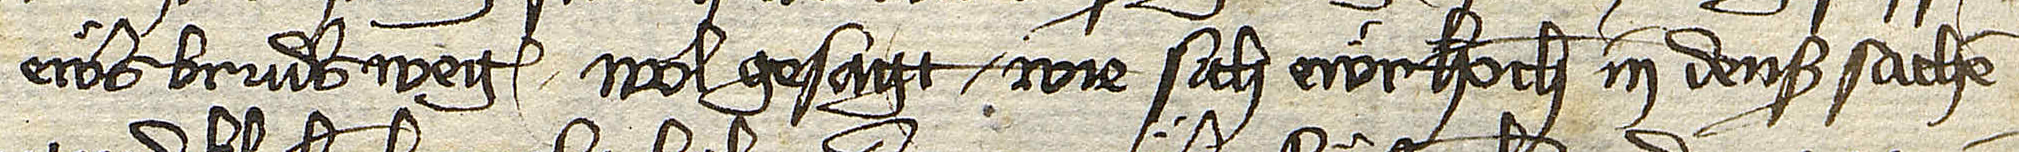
eẅ*s brud*s weg* / wol geſagt / wie ſich eẅr Hoch* in denſ* ſache*
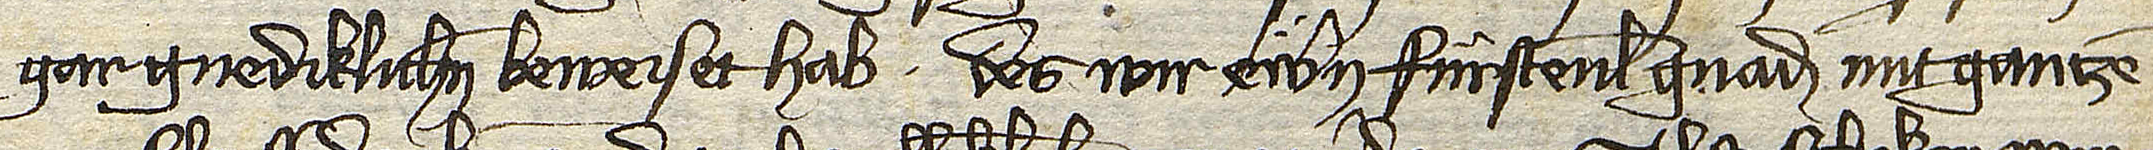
gar gnediklichn* beweiſet hab / Des wir eẅ*n fürſtenl* gnad* mit gancʒe*
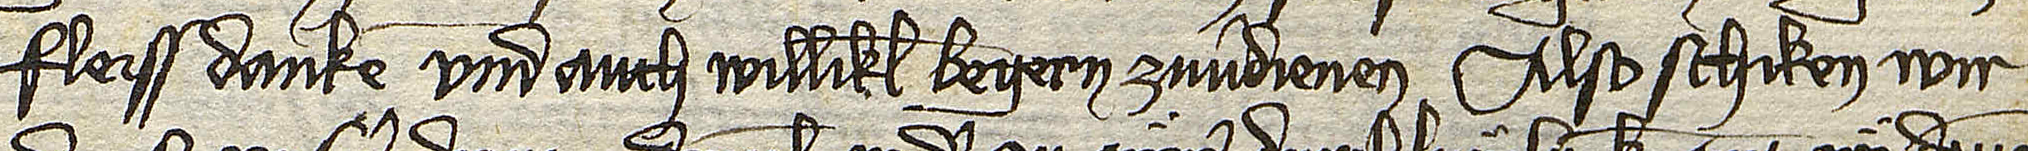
fleiſſ danke* vnd auch willikl* begern ʒuu*dienen Alſo ſchiken wir
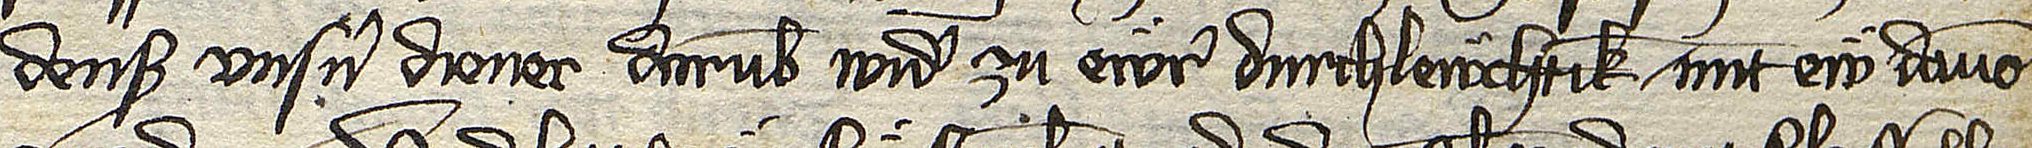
denſ* vnſn* diener darub* wid* ʒu eẅr* durchleẅtik* / mit eẅ dauo*
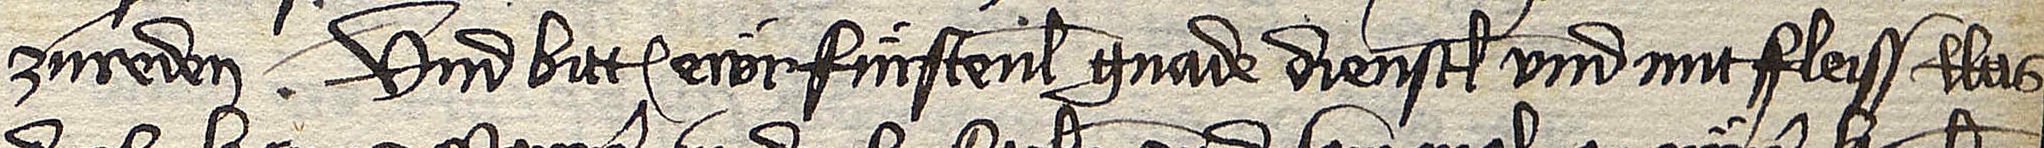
ʒureden / Vnd bitt* eẅr fürſtenl* gnade dienſtl* vnd mit fleiſſ / was
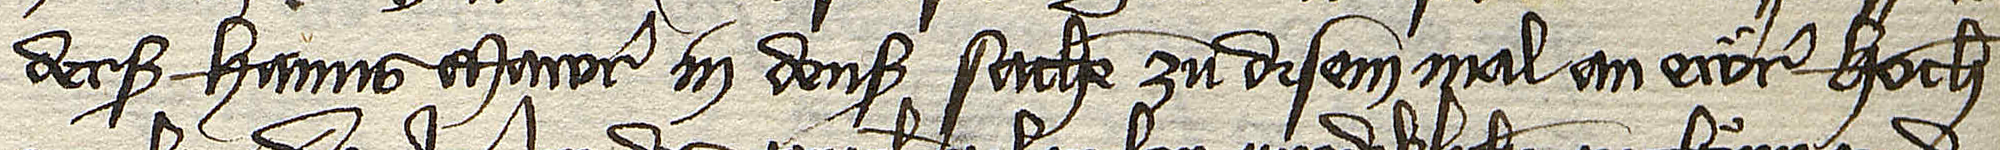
derſ* Hanns Mawr* in denſ* ſache* ʒu diſem mal an eẅr* Hoch*
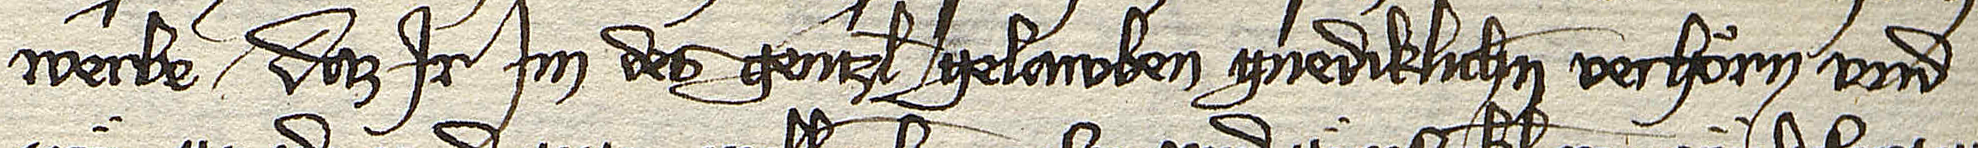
werbe / Daʒ Ir Im des gencʒl* gelawben gnediklichn* verhörn vnd
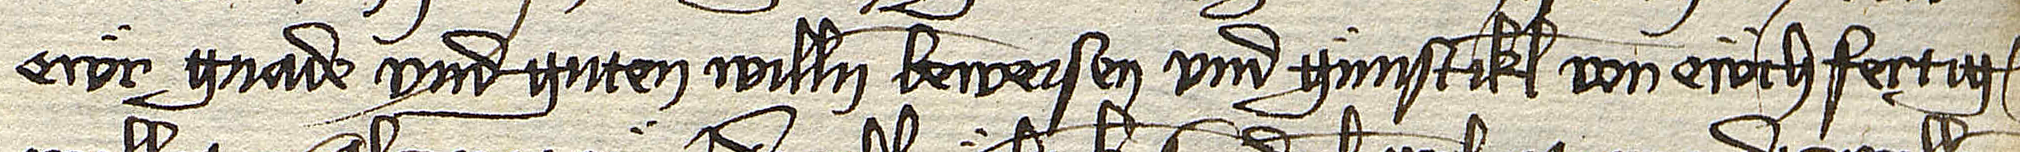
eẅr gnade vnd guten willn* beweiſen vnd günſtikl* von eẅch fertig*
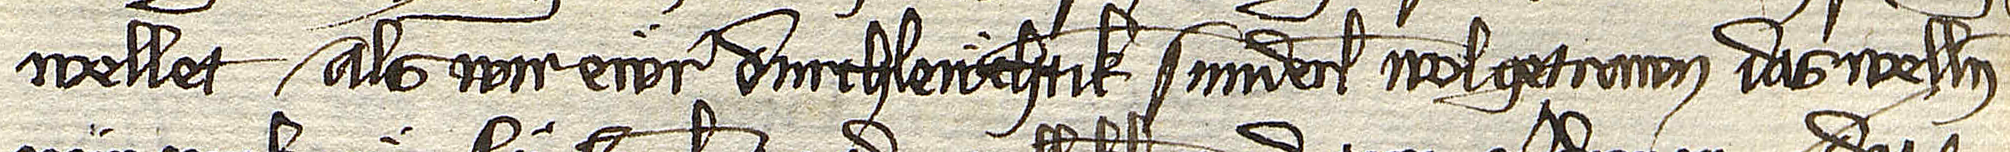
wellet / als wir eẅr* durchleẅchtik* ſunderl* wol getrawn das welln*
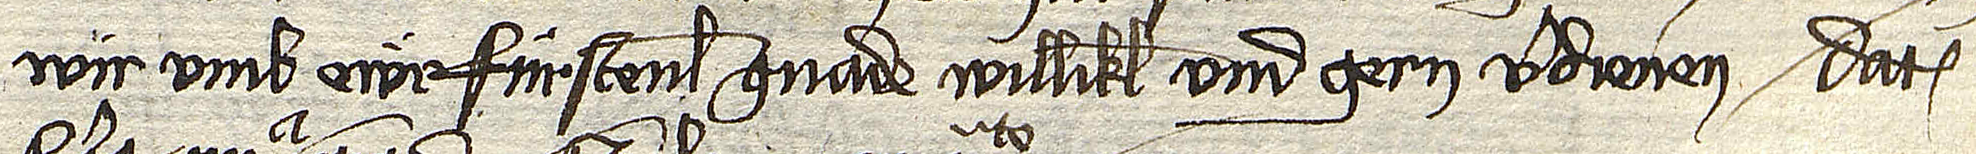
wir vmb eẅr fürſtenl* gnade willikl* vnd gern v*dienen / Dat*
